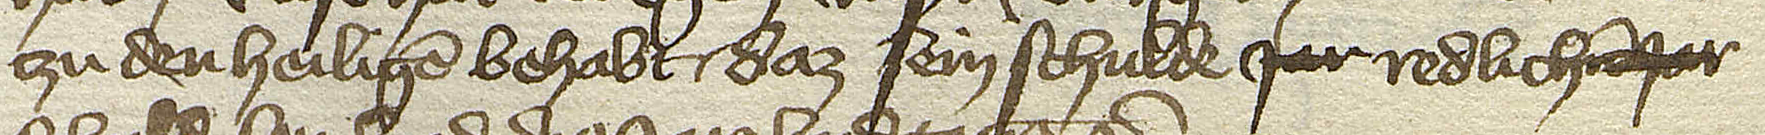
cʒu den heilige* behabt / daʒ ſein ſchulde Iar redlichn* Iar
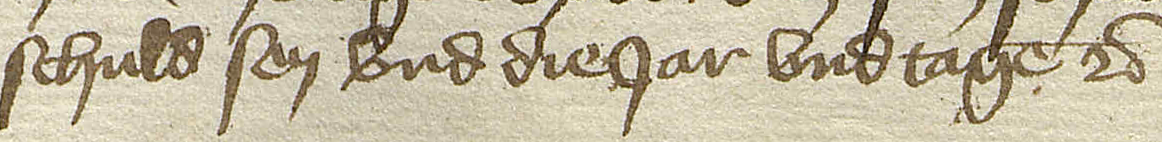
ſchuld ſey vnd die Iar vnd tage ec*
